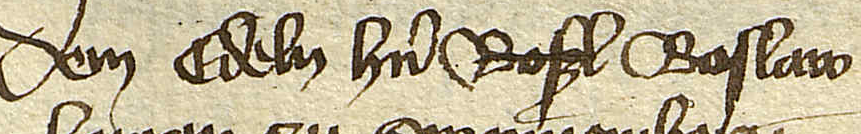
Dem Edeln hn* Boſʒl Boſlaw
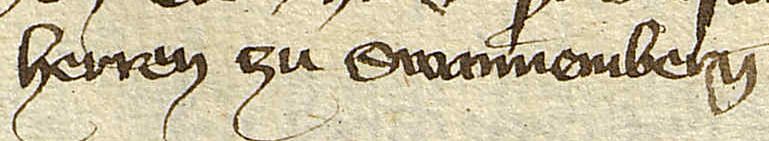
herren cʒu Swannemberg
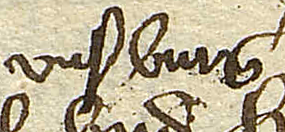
vnſ* burg*
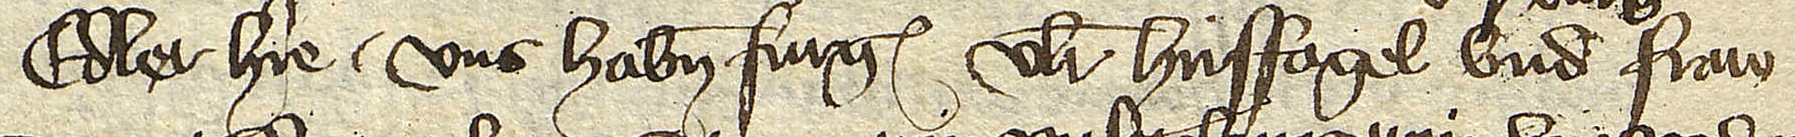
Edler h*re / vns habn* fürg* / vlr* hirſfogel vnd fraw
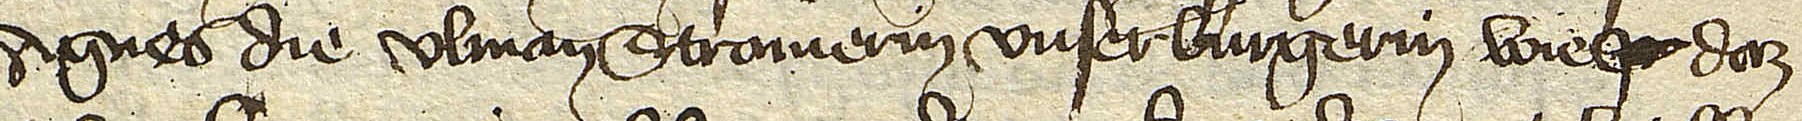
Agnes die vlman Stromerin vnſer burgerin wie Ir daʒ
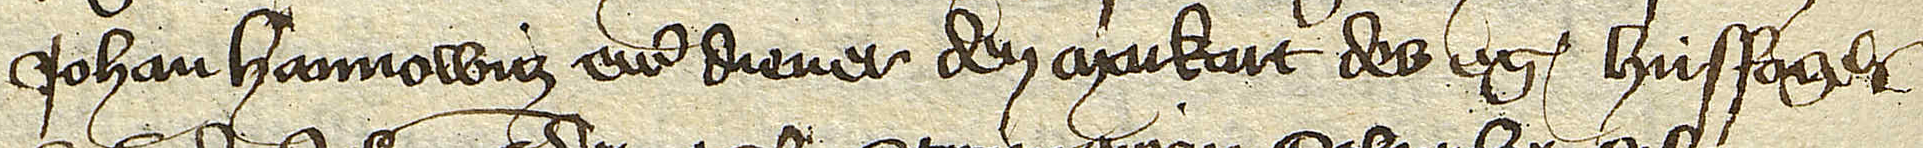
Iohan Hannowicʒ ew* diener den Markart des eg* hirſfogels
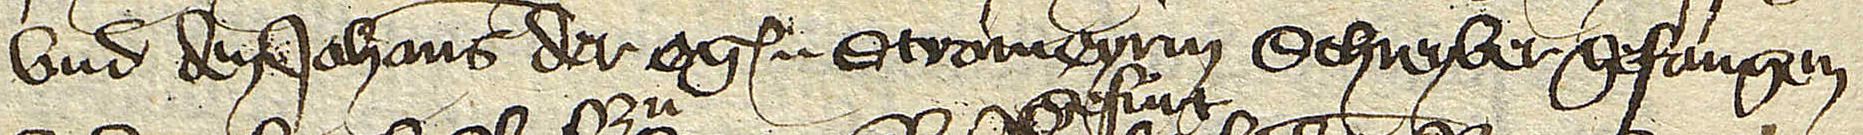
vnd den Iohans* der eg* ~ Stromerin Schreyber gefangen
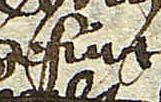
gefürt
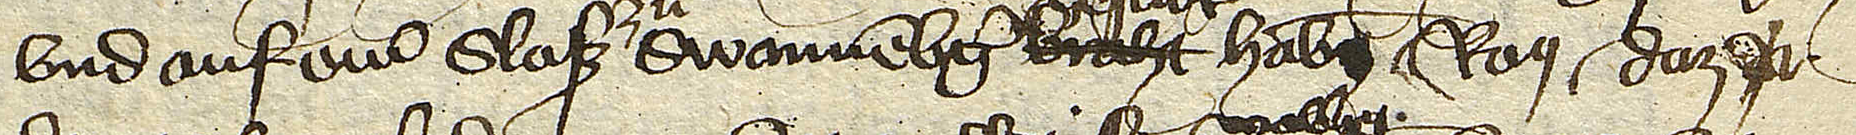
vnd auf ew* Sloſʒ Swanne*bg* braht habn* / Ro* / daʒ Ir
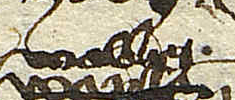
wollet
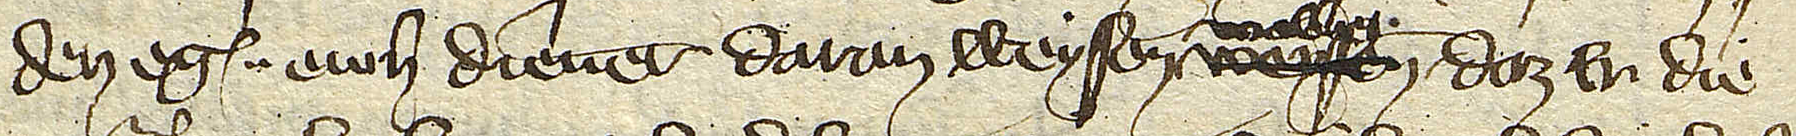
den eg* ~ ewn* diener daran weyſen weyſen / daʒ Er die
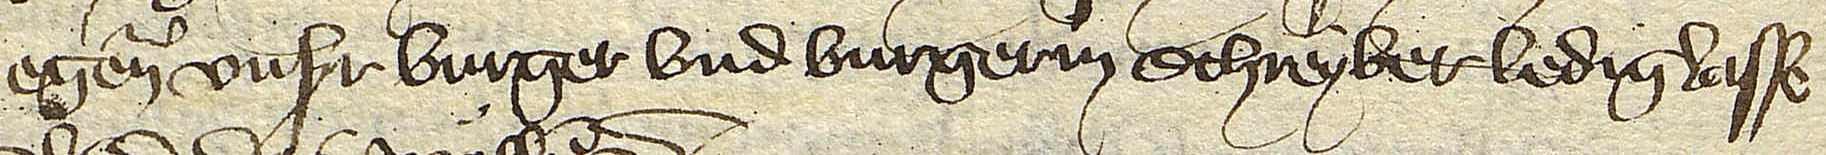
egen* vnſ*r burger vnd burgerin Schreyber ledig laſſe
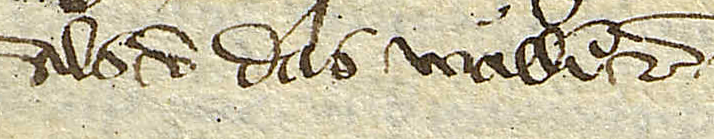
Als ec* das wölle* ec*
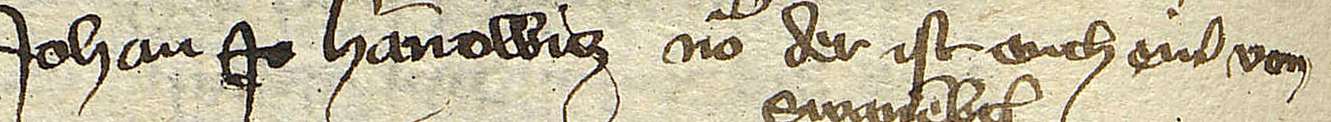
Iohan Ir Hanowicʒ no* der iſt auch ein* vom
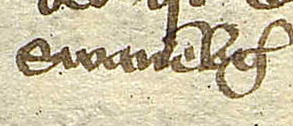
Swane*bg*
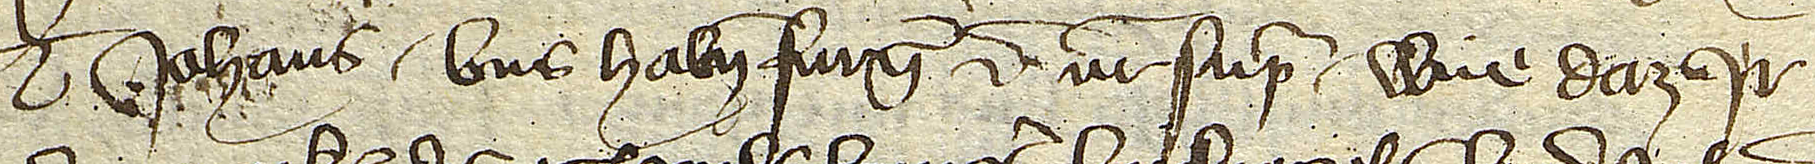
L* Iohans / vns habn* furg* ec* ur* ſup* / wie daʒ Ir
